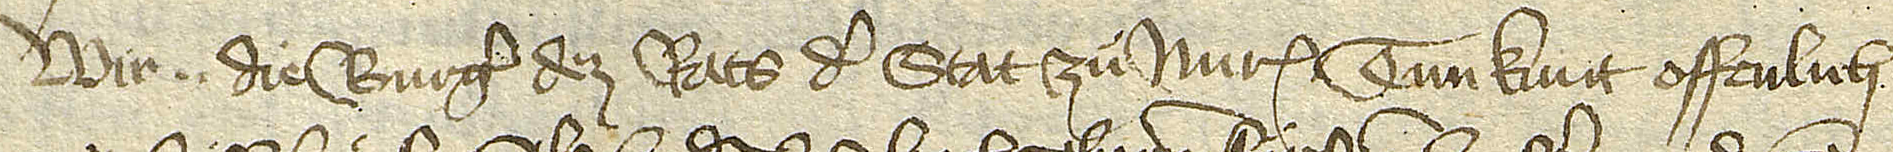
Wir ~ die Burg* deʒ Rats d* Stat cʒü Nur* Tun kunt offenlich
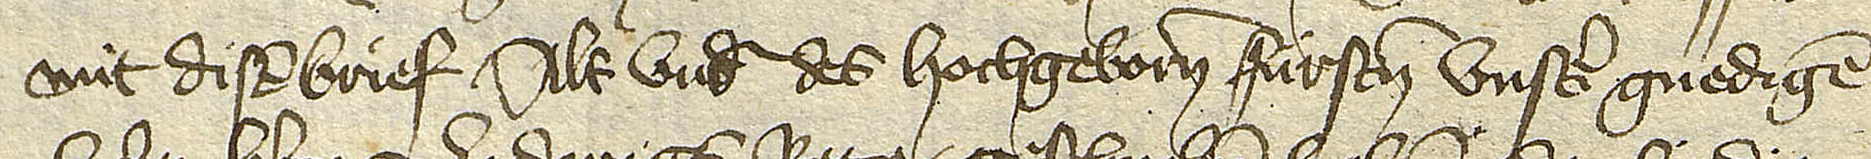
mit diſe* brief / Als vns des hochgeborn* fürſtn* vnſs* gnedige*
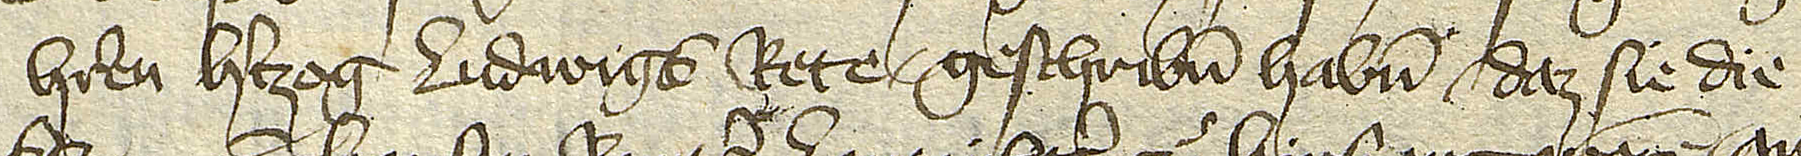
hr*en h*cʒog Ludwigs Rete / geſchribn* habn* / daʒ ſie die
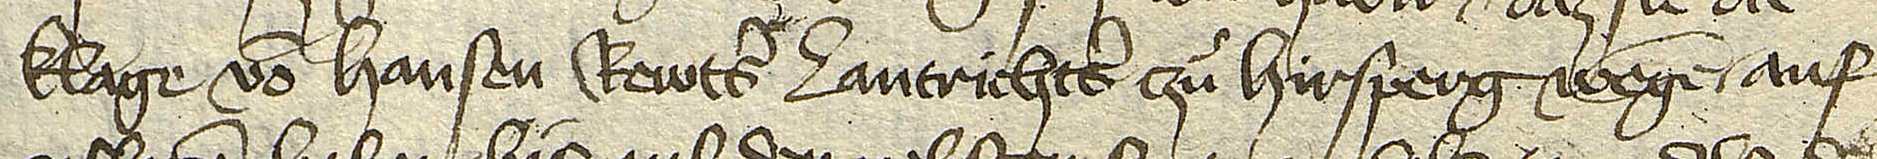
klage vo* hanſen Rewts* Lantrichts* cʒü hirſperg wege* / auf
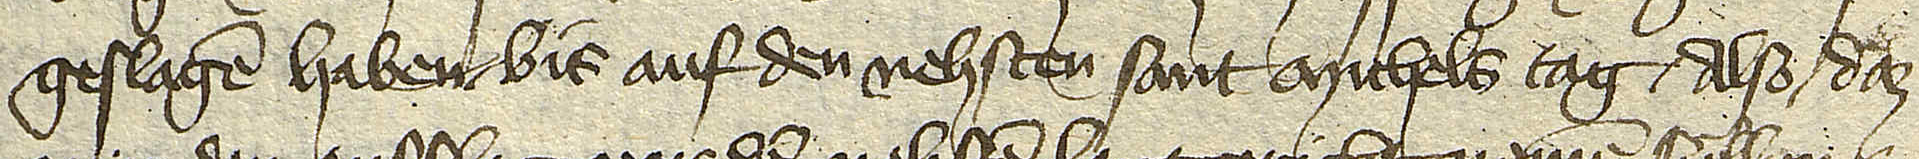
geſlage* haben / bis auf den nehſten ſant Michels tag / Alſo / daʒ
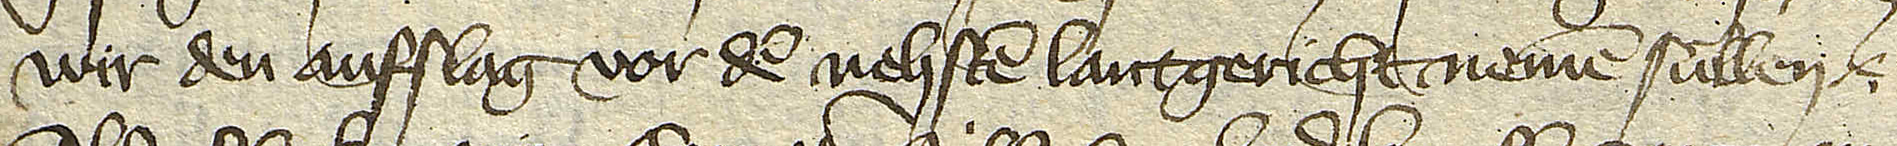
wir den aufſlag vor d* nehſte* lantgericht neme* ſüllen / .
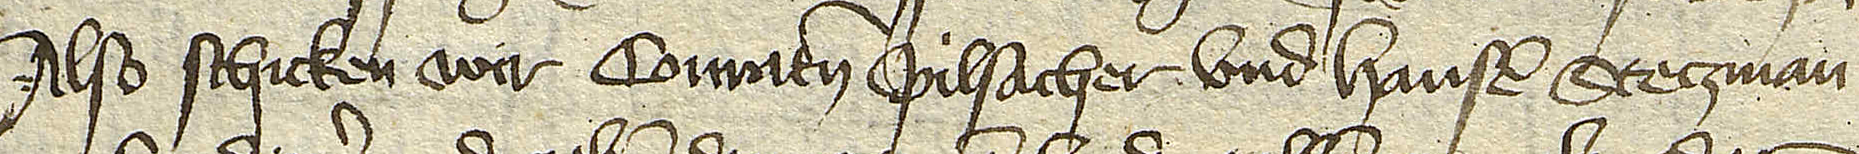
Alſo ſchicken wir Conratn* Pilſacher vnd hanſe* Stecʒman
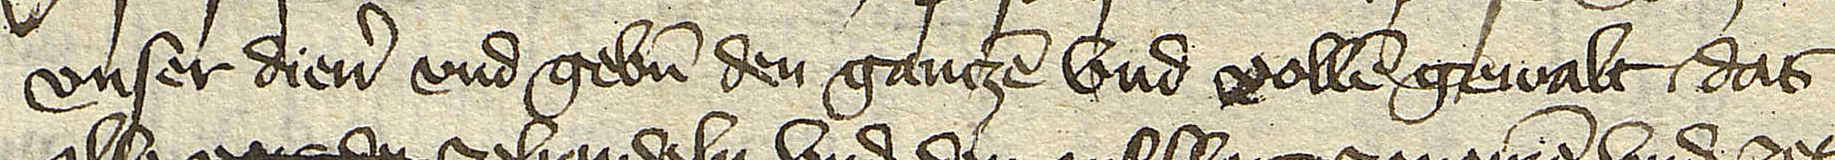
vnſer dien* vnd gebn* den gancʒe* vnd volle* gewalt / das
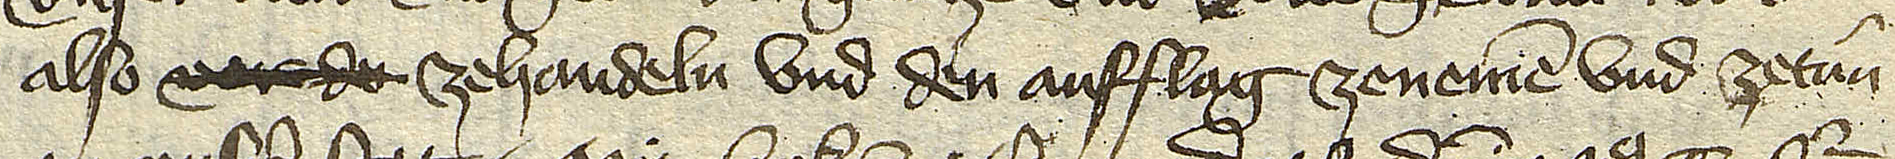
alſo vor de cʒehandeln vnd den aufſlag cʒeneme* vnd cʒetün
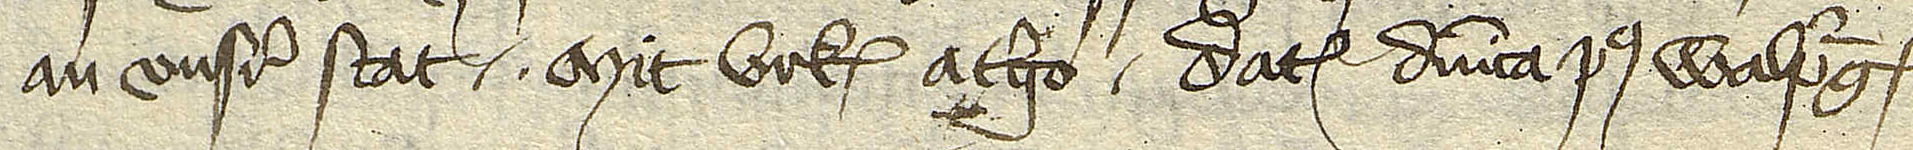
an vnſr* ſtat / . Mit vrk* at*go / Dat* dnica* p* Walp*g*
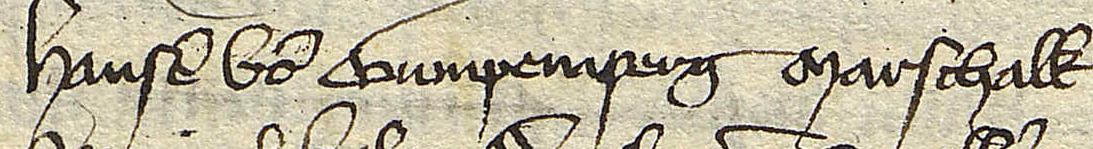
hanſe* vo* Gwnpemperg Marſchalk
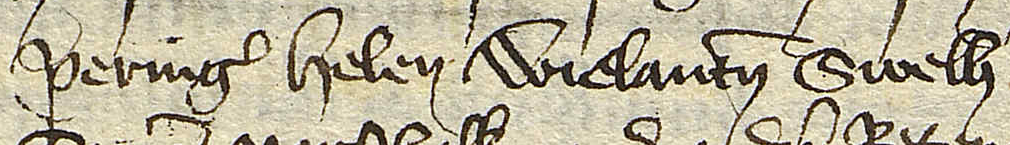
Pering* helen / Wielantn* Swelh*
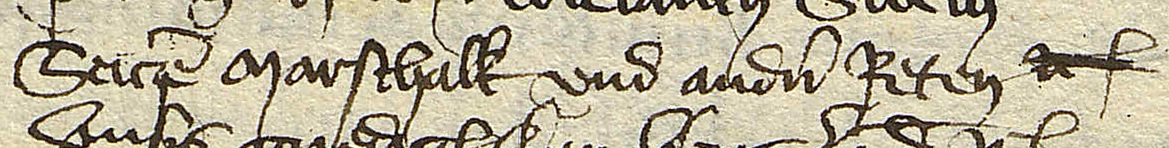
Seicʒe* Marſchalk vnd andn* Reten ec*
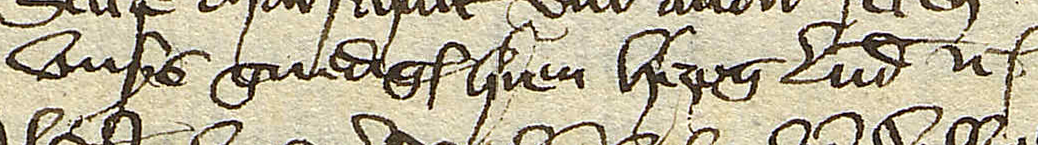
vnſ*s gnedig* h*ren h*cʒog Lud* ec*
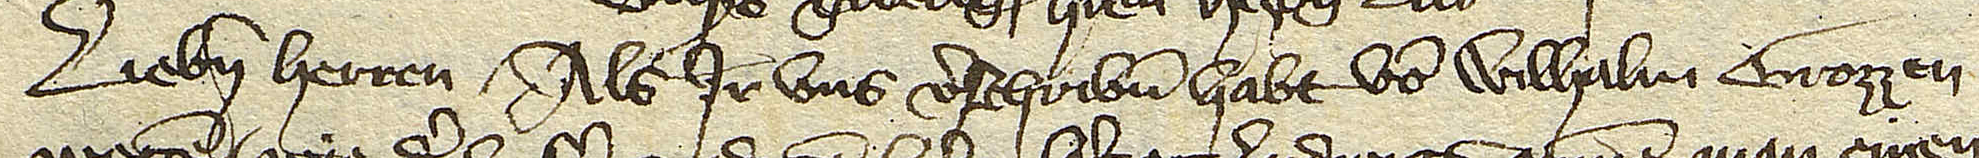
Liebn* herren / Als Ir vns v*ſchribn* habt vo* Wilhalm Groʒʒen
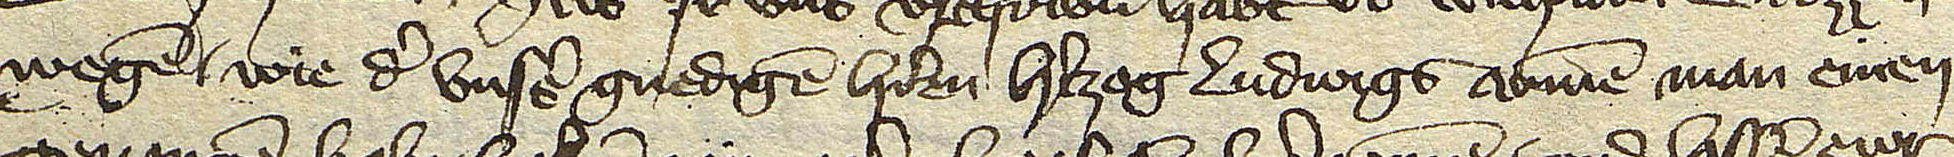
wege* / wie d* vnſs* gnedige* hr*en h*cʒog Ludwigs arme* man einen
